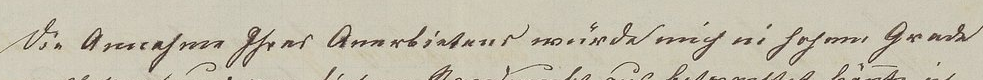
Die Annahme Ihres Anerbietens würde mich in hohem Grade
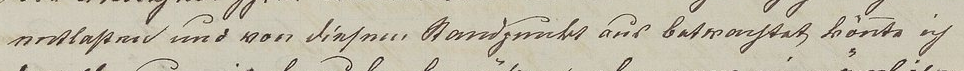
entlasten und von diesem Standpunkt aus betrachtet, könnte ich
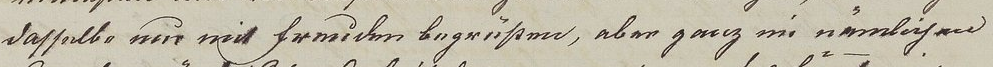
dasselbe nur mit Freuden begrüßen, aber ganz im nämlichen
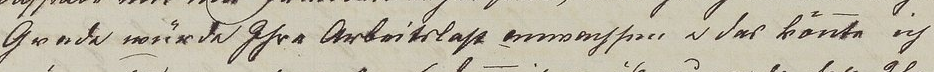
Grade würde Ihre Arbeitslast anwachsen & das könnte ich
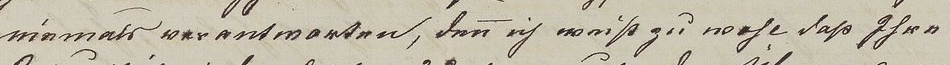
niemals verantworten, denn ich weiß zu wohl daß Ihre
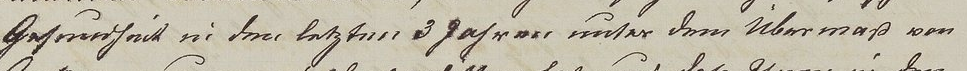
Gesundheit in den letzten 3 Jahren unter dem Übermaß von
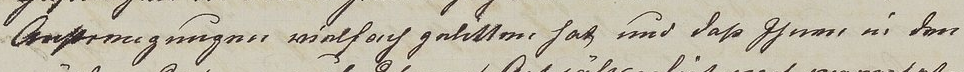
Anstrengungen vielfach gelitten hat und daß Ihnen in den
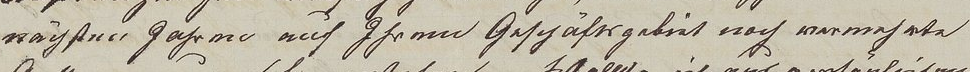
nächsten Jahren auf Ihrem Geschäftsgebiet noch vermehrte
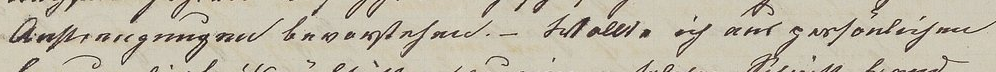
Anstrengungen bevorstehen. – Wollte ich aus persönlichen
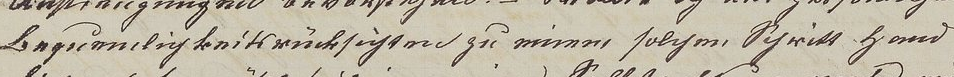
Bequemlichkeitsrücksichten zu einem solchen Schritt Hand
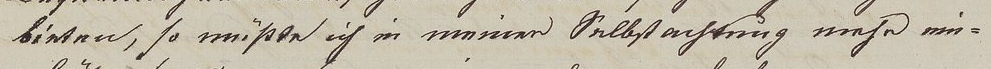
bieten, so müßte ich in meiner Selbstachtung mehr ein-
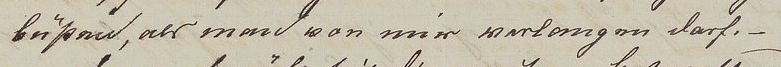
büßen, als man von mir verlangen darf. –
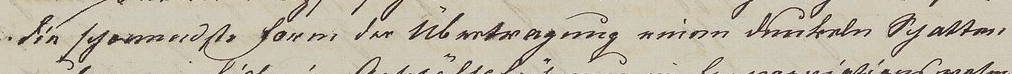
die schonendste Form der Übertragung einen dunklen Schatten
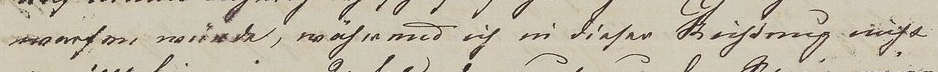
werfen würde, während ich in dieser Richtung nicht
